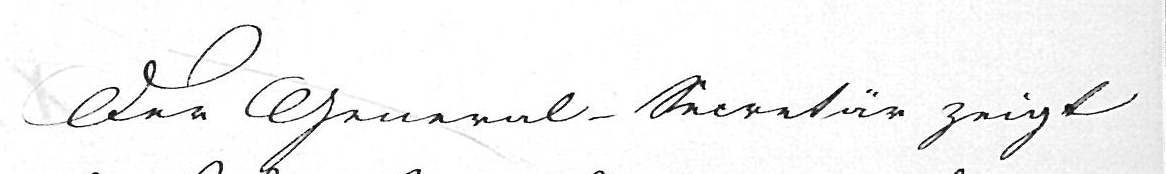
Der General-Secretär zeigt
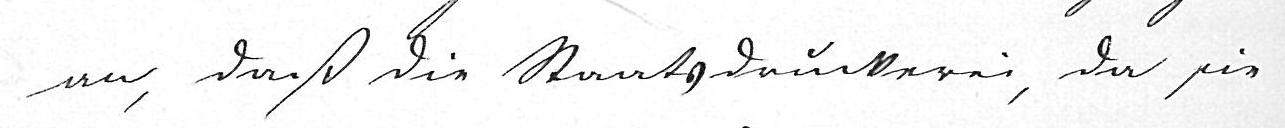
an, daß die Staatsdruckerei, da sie
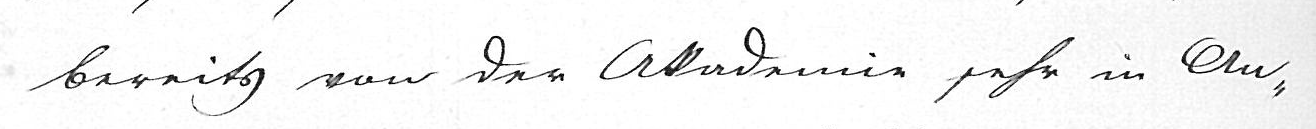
bereits von der Akademie sehr in An-
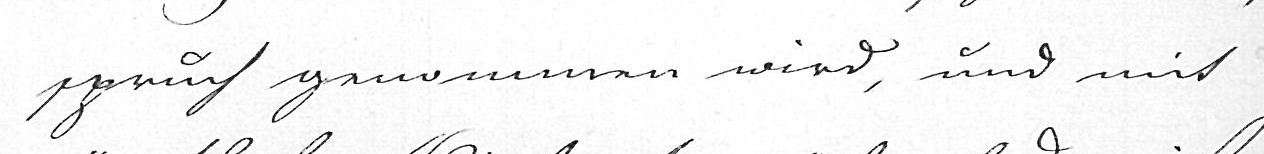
spruch genommen wird, und mit
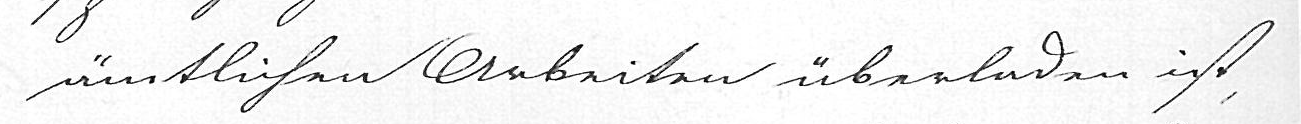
ämtlichen Arbeiten überladen ist,
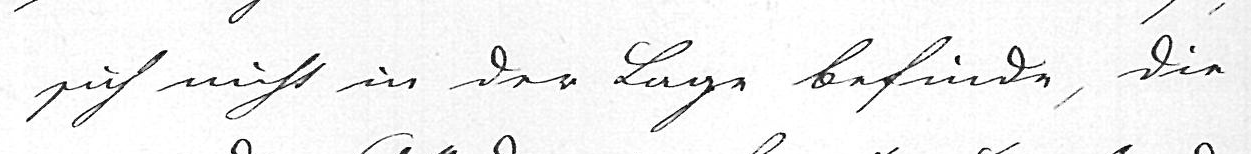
sich nicht in der Lage befinde, die
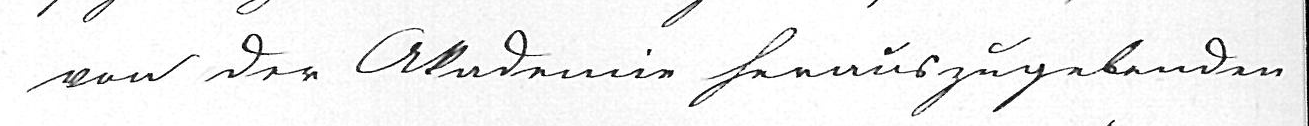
von der Akademie herauszugebenden
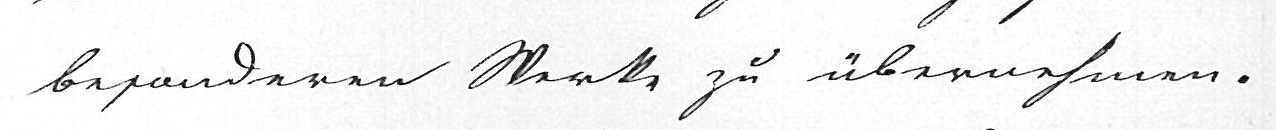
besonderen Werken zu übernehmen.
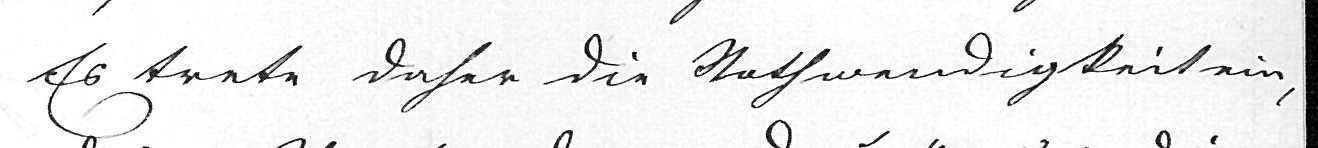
Es trete daher die Nothwendigkeit ein,
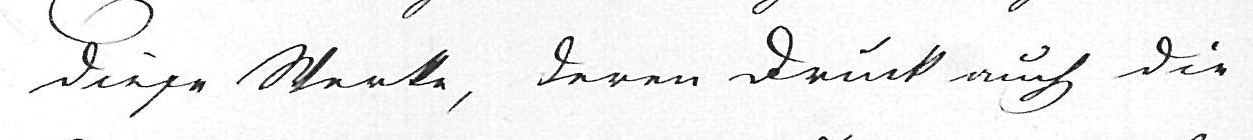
diese Werken, deren Druck auch die
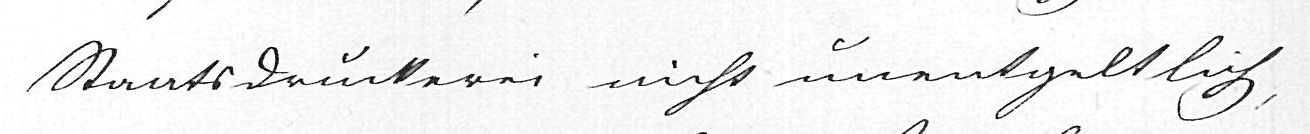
Staatsdruckerei nicht unentgeltlich,
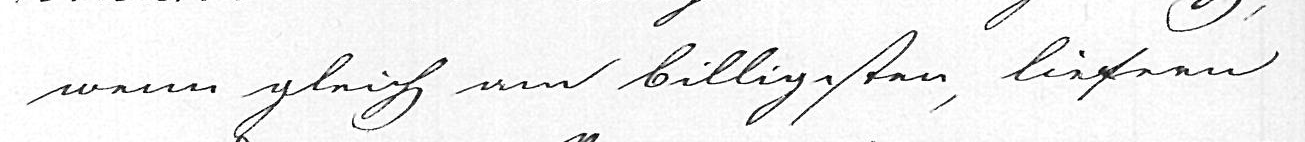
wenn gleich am billigsten, liefern
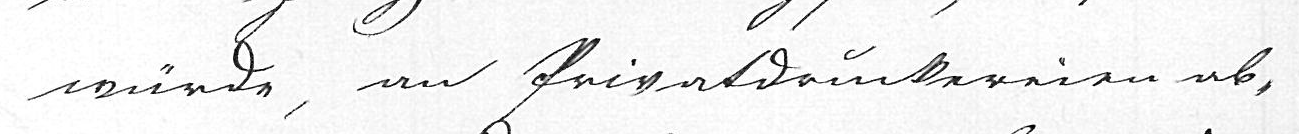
würde, an Privatdruckereien ab-
